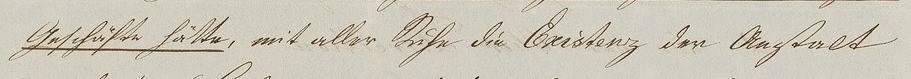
Geschäfte hätte, mit aller Ruhe die Existenz der Anstalt
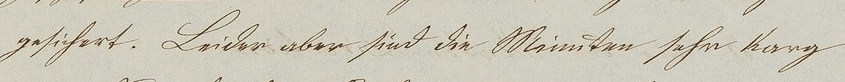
gesichert. Leider aber sind die Minuten sehr kurz
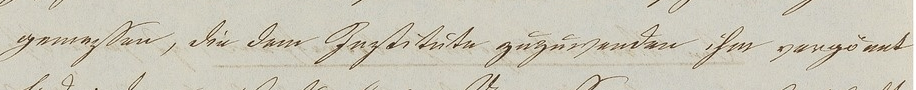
gemessen, die dem Institute zuzuwenden ihm vergönnt
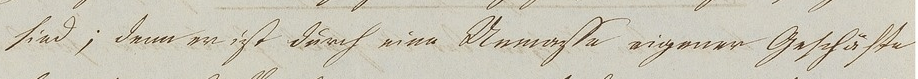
sind; denn er ist durch eine Unmasse eigener Geschäfte
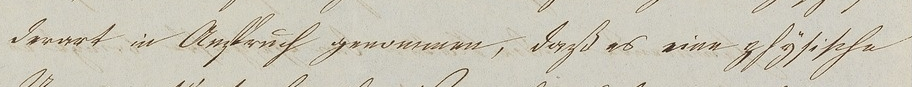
derart in Anspruch genommen, daß es eine physische
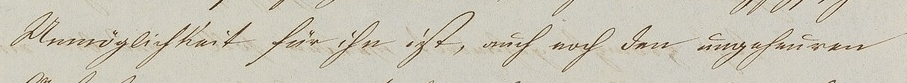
Unmöglichkeit für ihn ist, auch noch den ungeheuren
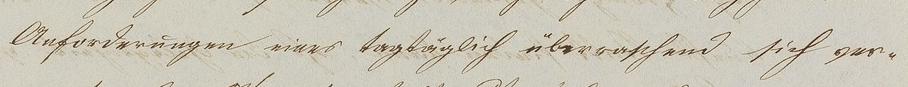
Anforderungen eines tagtäglich überraschend sich ver-
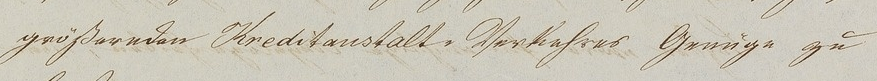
größernden Kreditanstalt-Verkehres Genüge zu
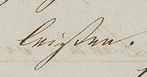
leisten.
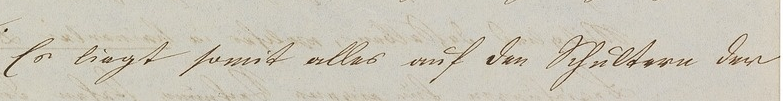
Es liegt somit alles auf den Schultern der
